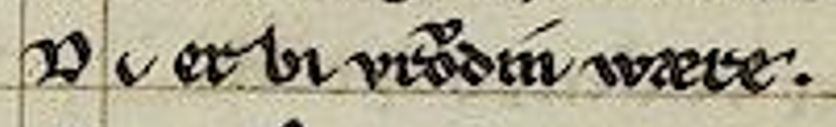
D(az) er bi vro°vden w[ae]re.
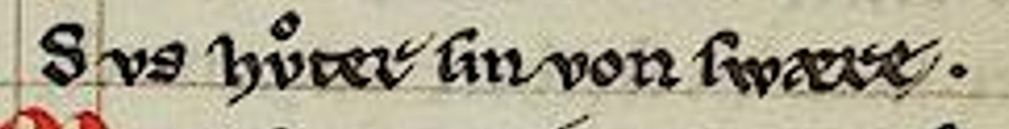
Svs hv°oter ſin von ſw[ae]re.
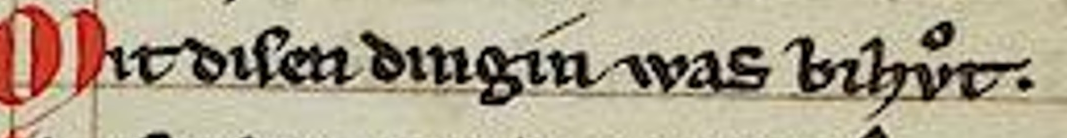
*Mit diſen dingin was bihv°ot.
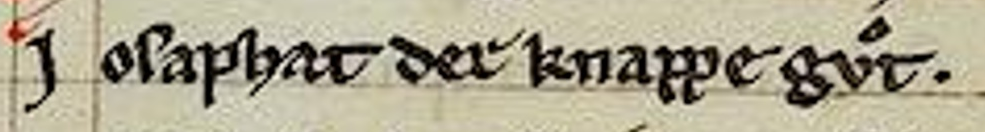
Josaphat der knappe gv°ot.
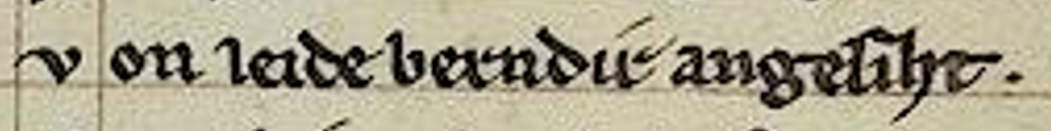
Von leide berndir angeſiht.
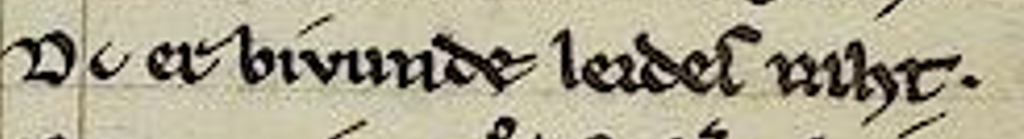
D(az) er bivunde leideſ niht.
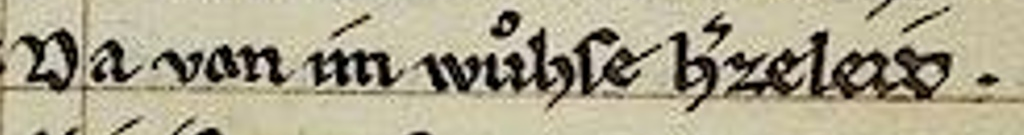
Da von im wu°ohſe h(er)zeleit.
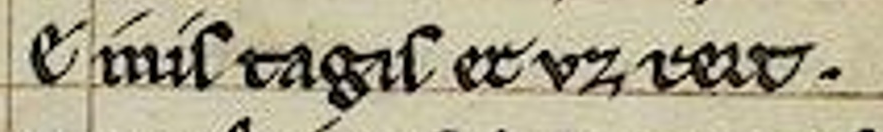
Einiſ tagiſ er vz reit.
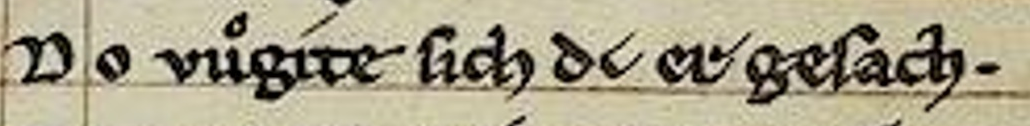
Do vu°ogite ſich d(az) er geſach.
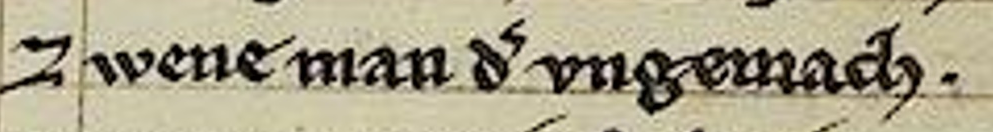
Zwene man d(er) vngemach.
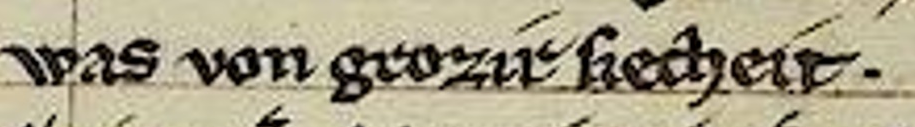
Was von grozir ſiecheit.
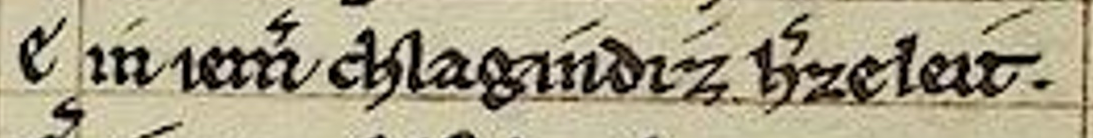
Ein iem(er) chlagindiz h(er)zeleit.
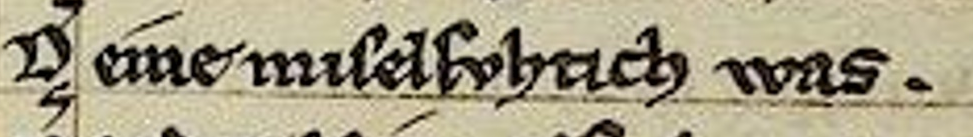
D(erI eine miſelſvhtich was.
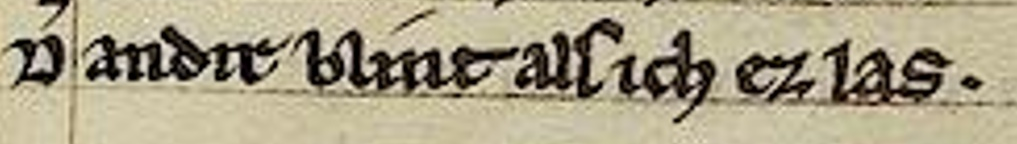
D(er) andir blint alſ ich ez las.
